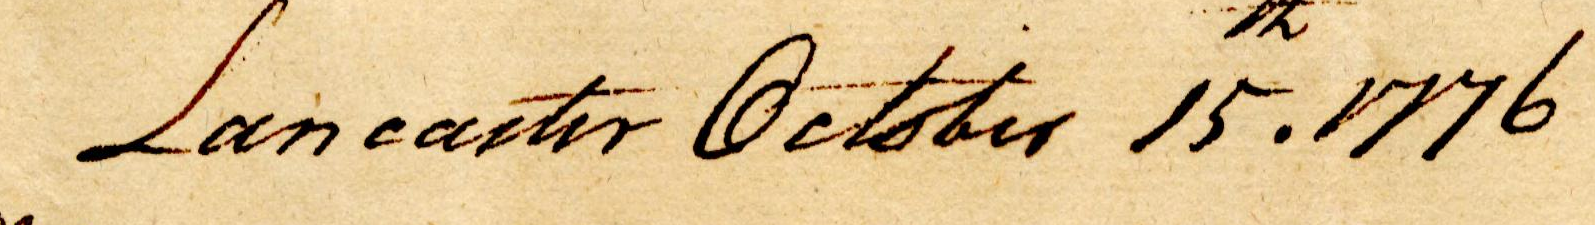Lancaster October 15^th. 1776
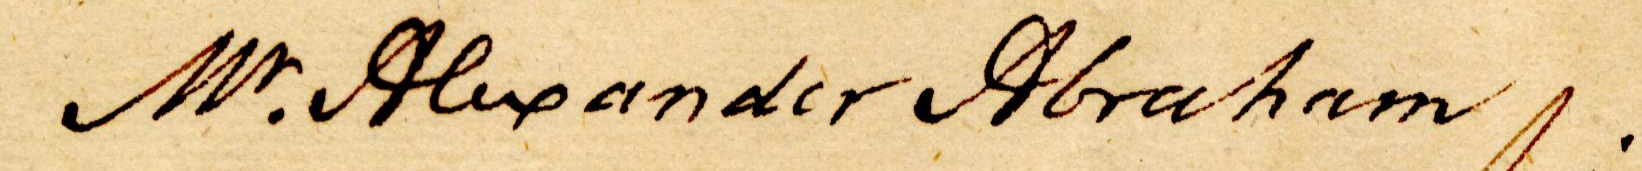M^r. Alexander Abraham
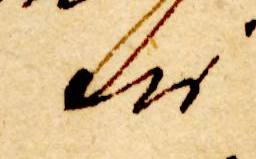Sir
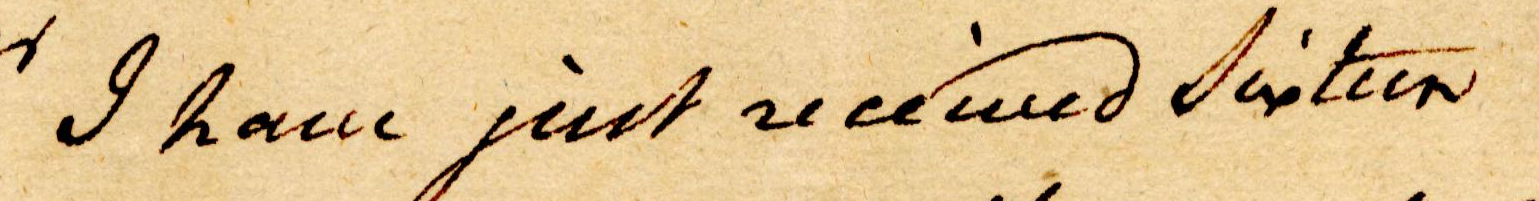I have just received sixteen
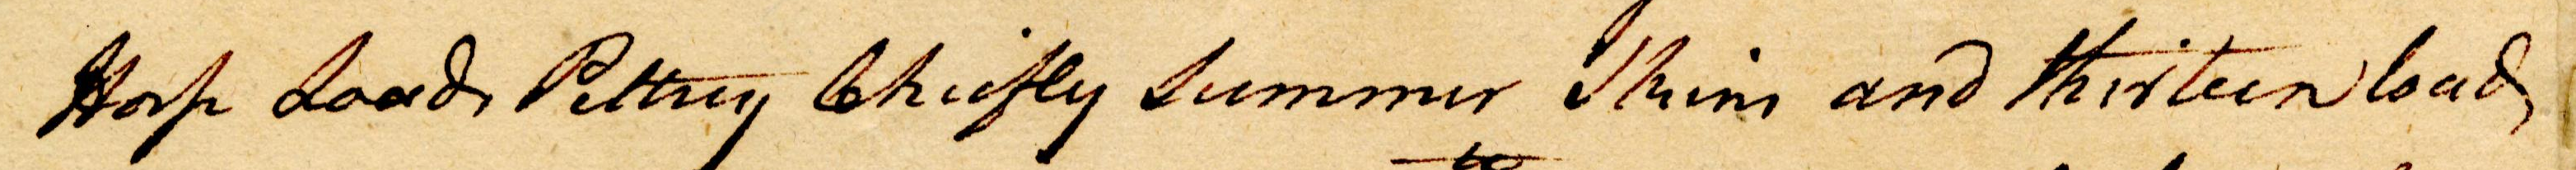Horse Loads Peltry Chiefly Summer skins and thirteen loads
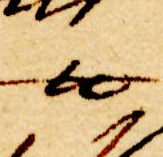to
